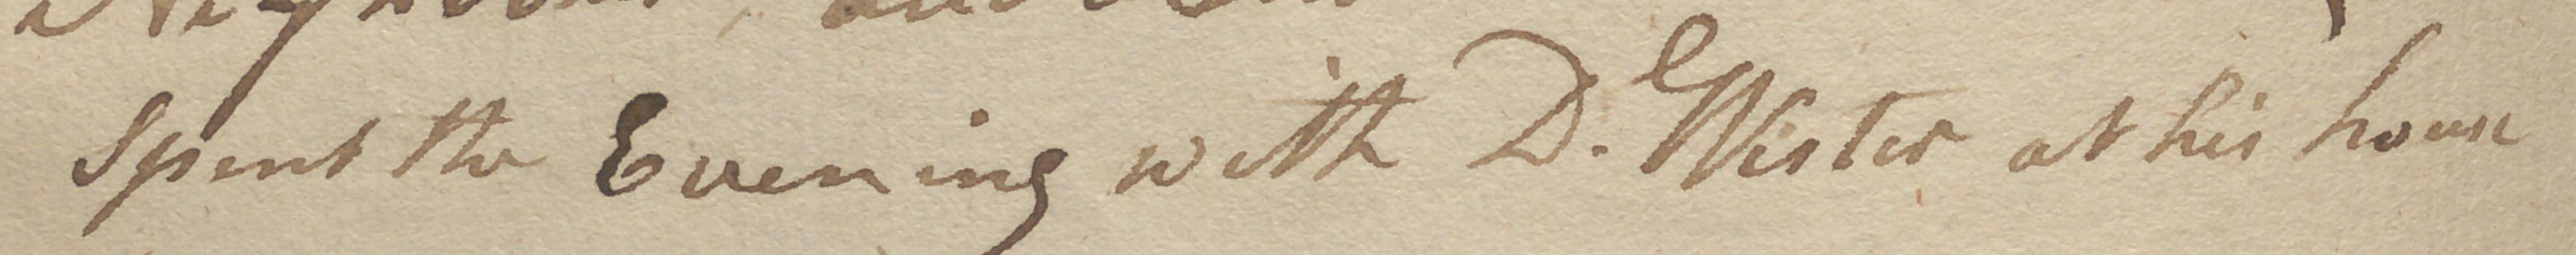spent the Evening with D^l. Wister at his house
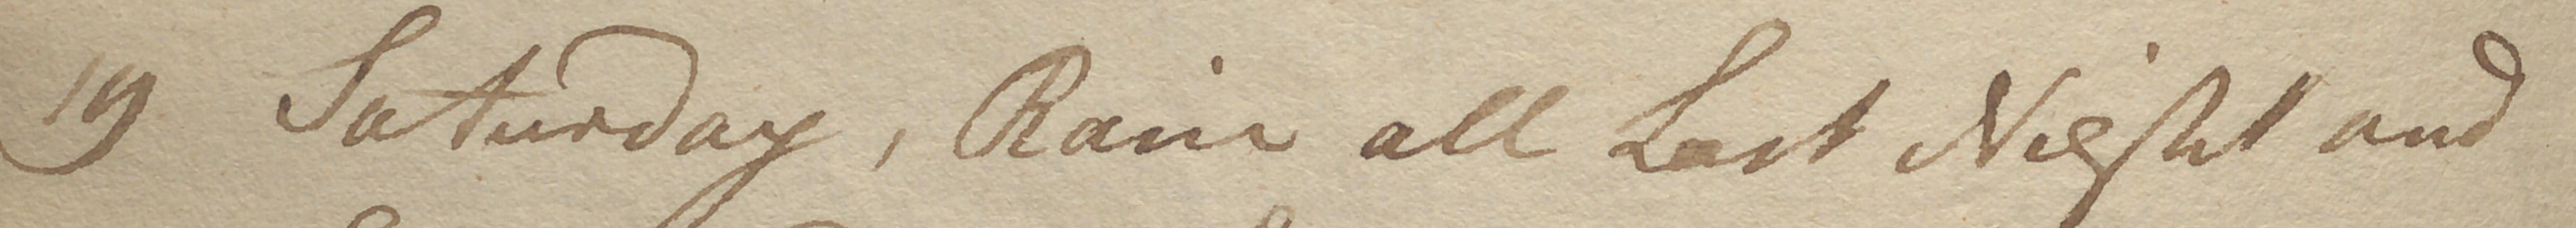19 Saturday, Rain all Last Night and
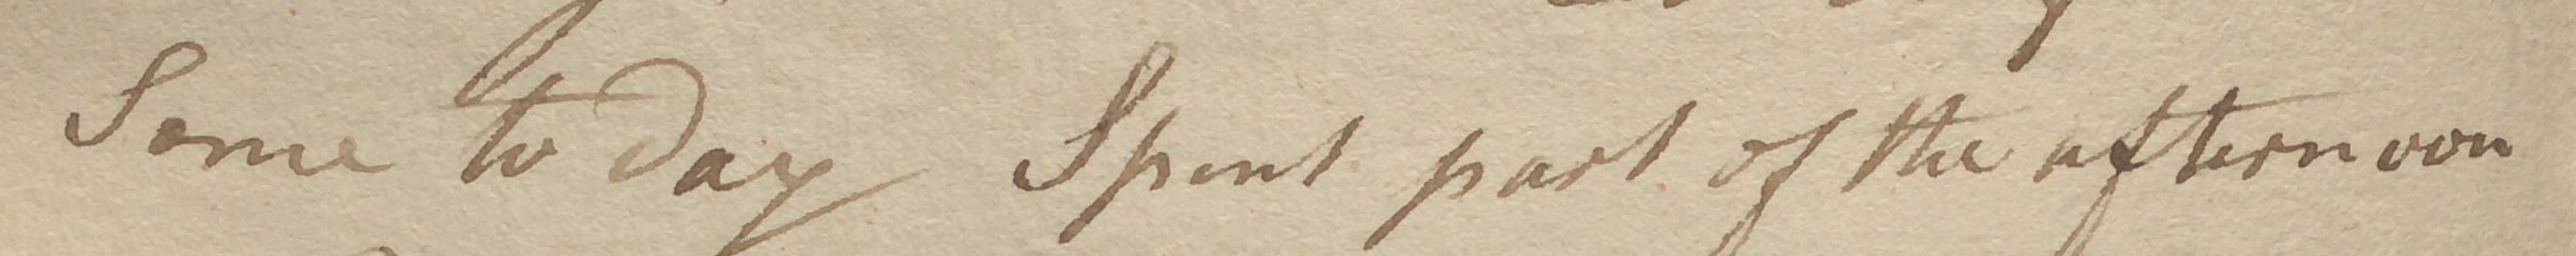some to day Spent part of the afternoon
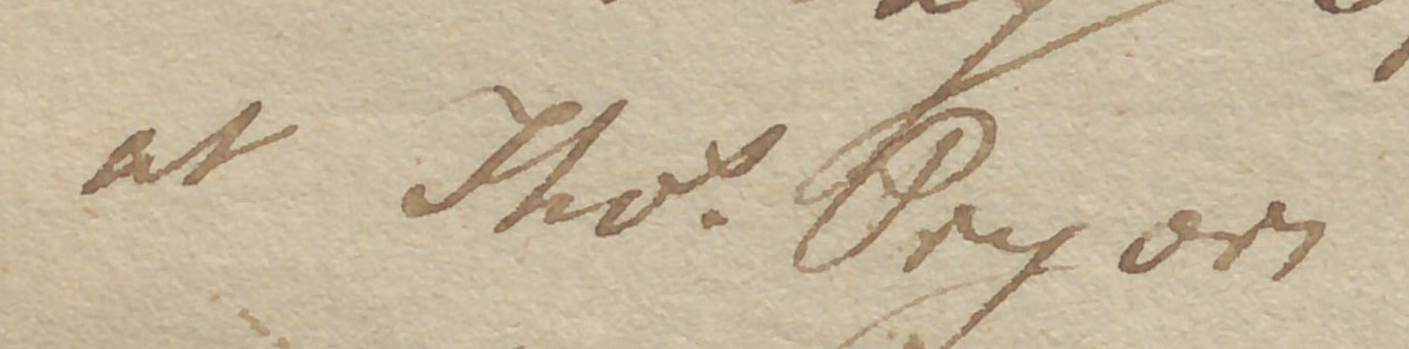at Tho^s. Pryors
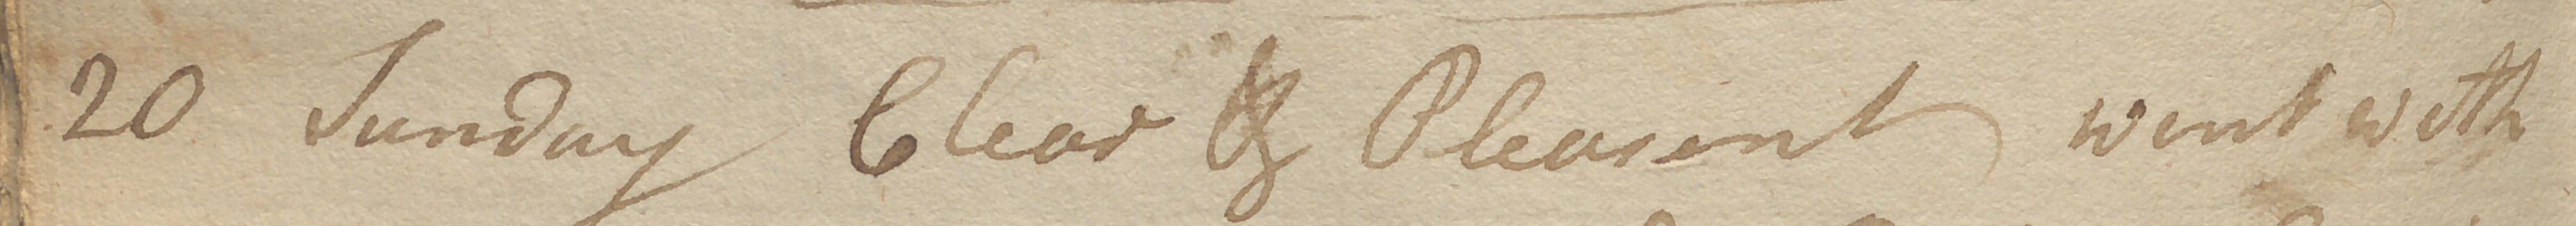20 Sunday, Clear & Pleasent went with
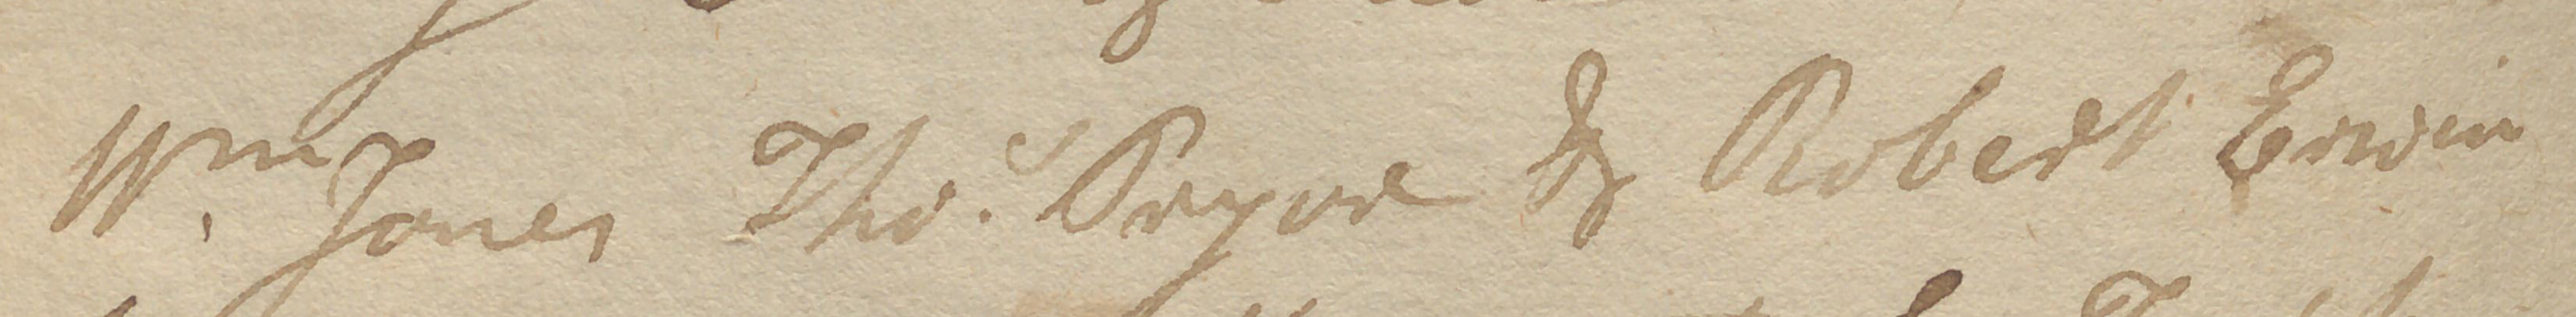W^m. Jones Tho^s. Pryor & Robert Erwin
